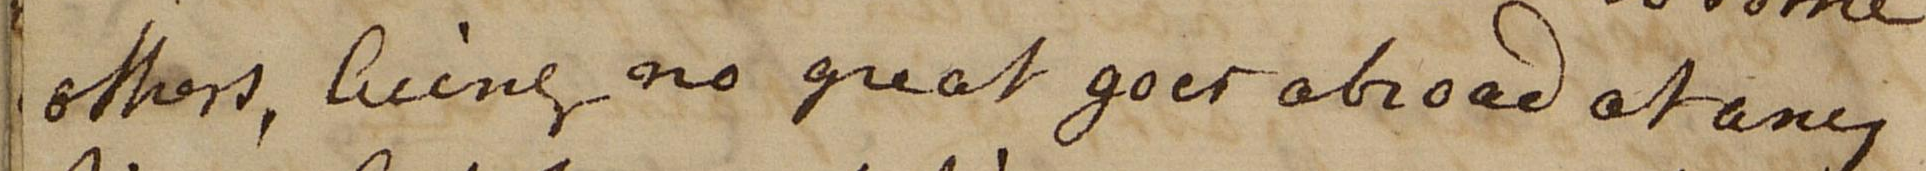others, being no great goer abroad at any
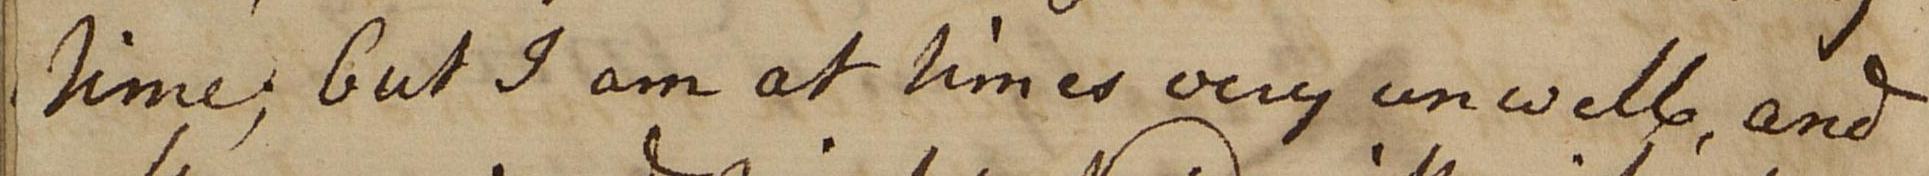Time, but I am at times very unwell, and
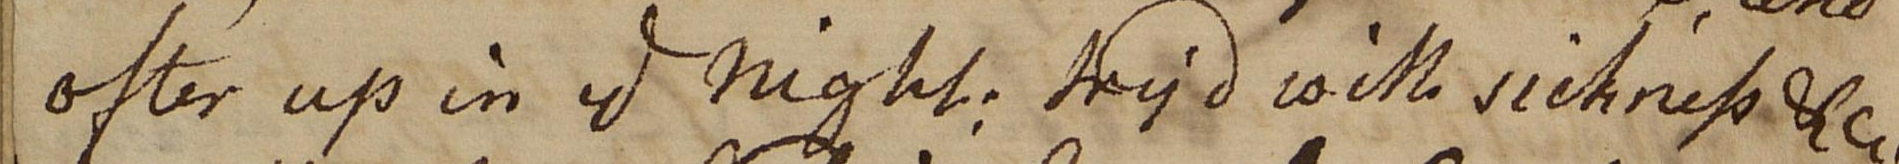after up in y^e night. try'd with sickness &c
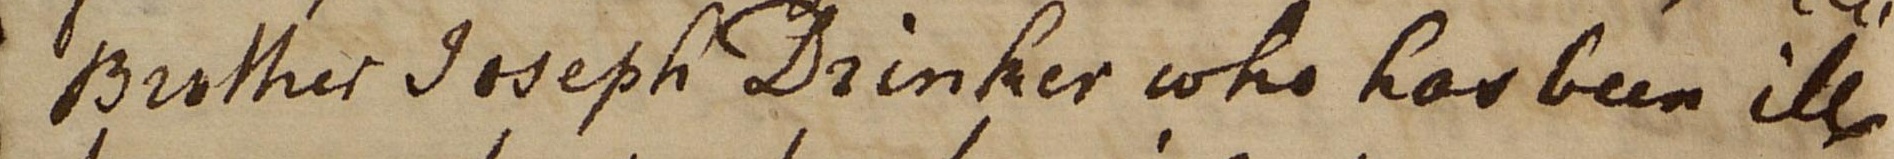Brother Joseph Drinker who has been ill
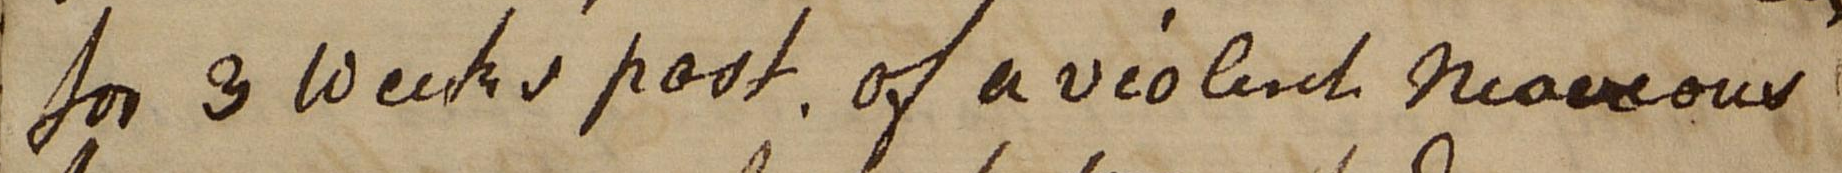for 3 Weeks past, of a violent nervous
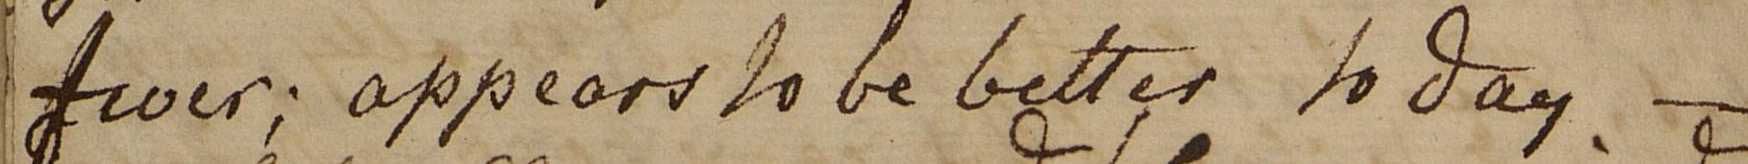fever; appears to be better to day-
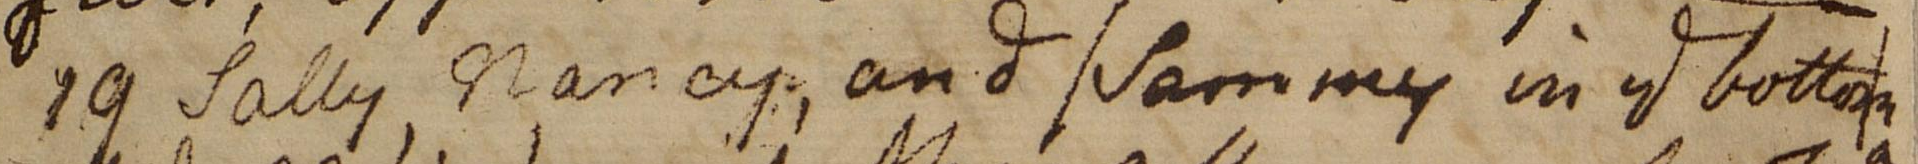19 Sally Nancy, and /Sammy in y^e bottom
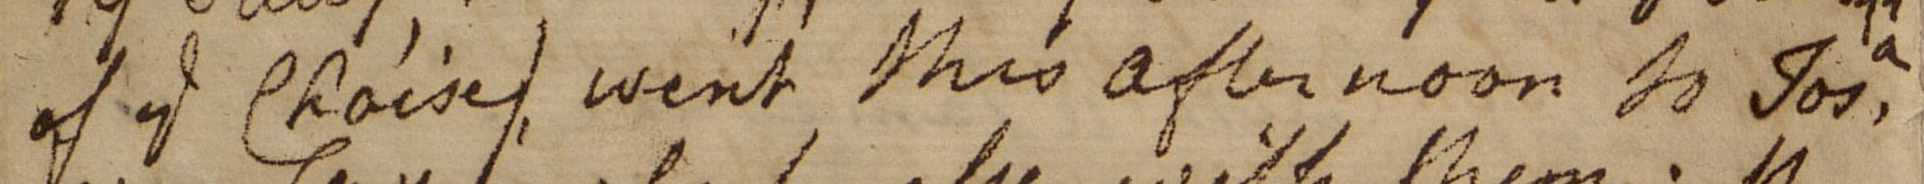of y^e Chaise/ went this afternoon to Jos^a,
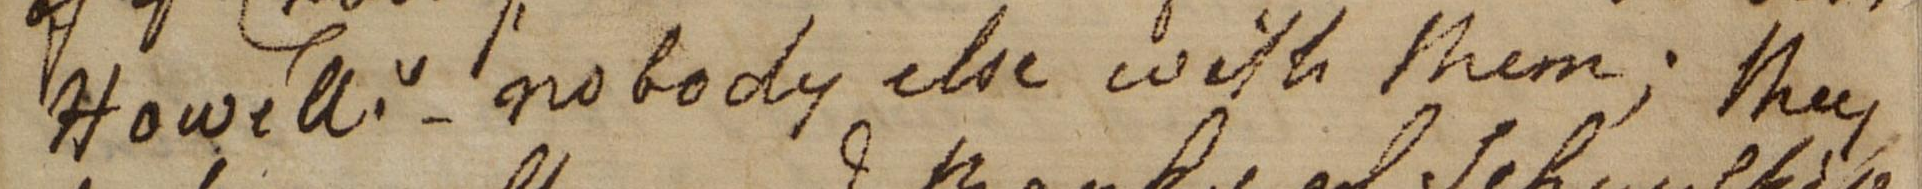Howell^s- nobody else with them; they
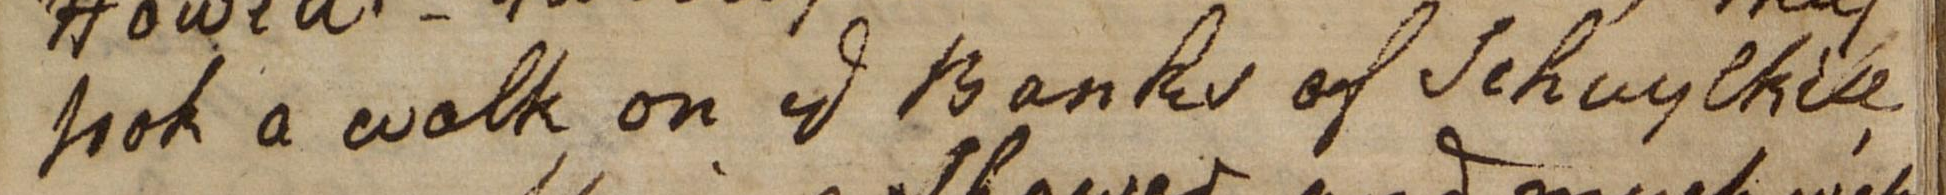took a walk on y^e Banks of Schuylkill
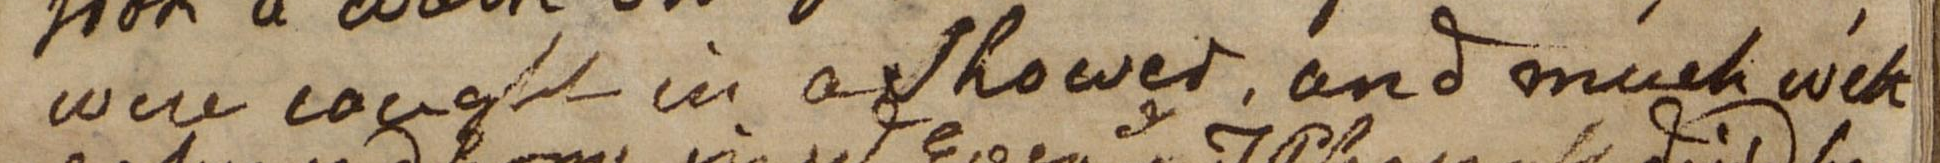were caught in a Shower, and much wett
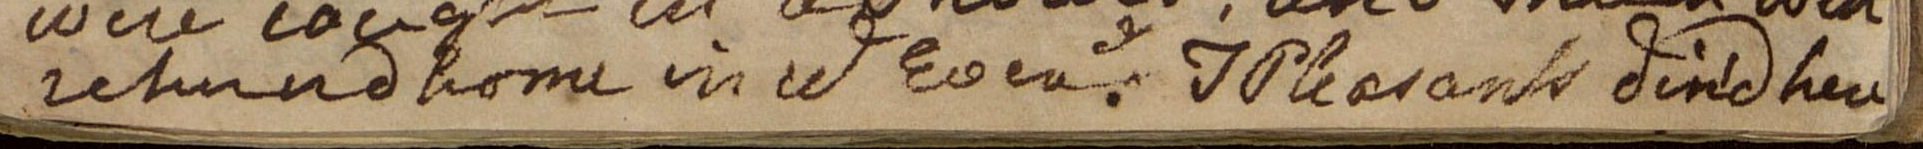returnd home in y^e Even.^g J Pleasants din'd here
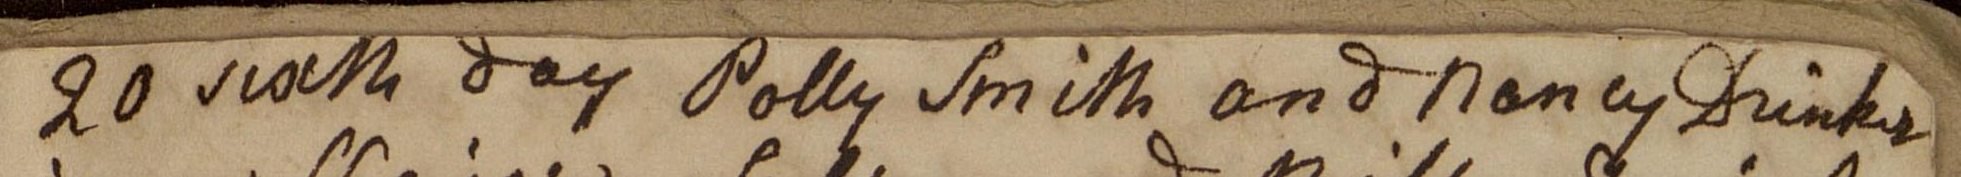20 sixth day Polly Smith and Nancy Drinker
